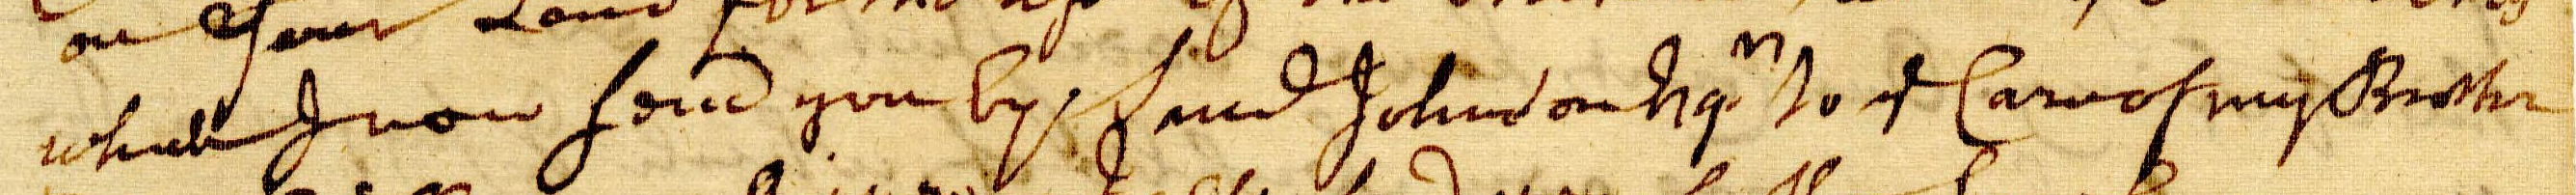which I now Send you by Sam^l Johnston Esq^r. to y^e Care of my Brother
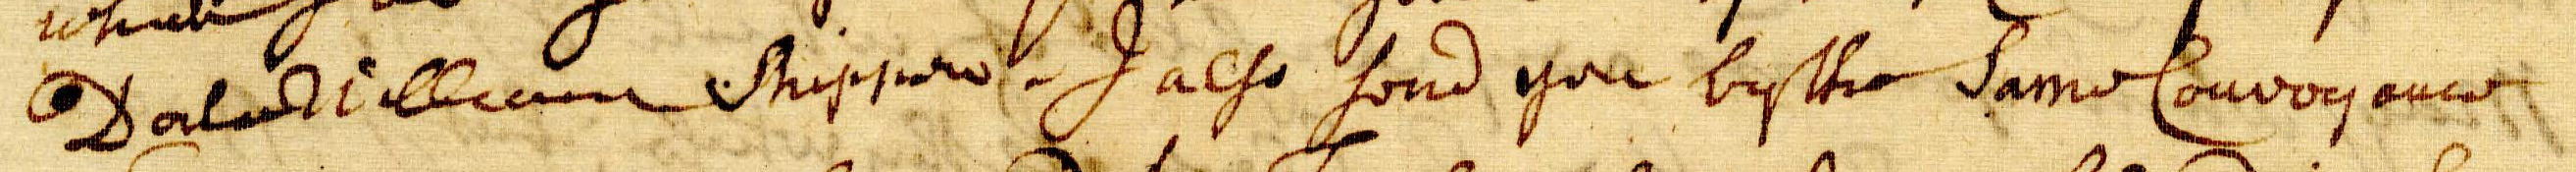Doctor William Shippen - I also send you by the Same Conveyance
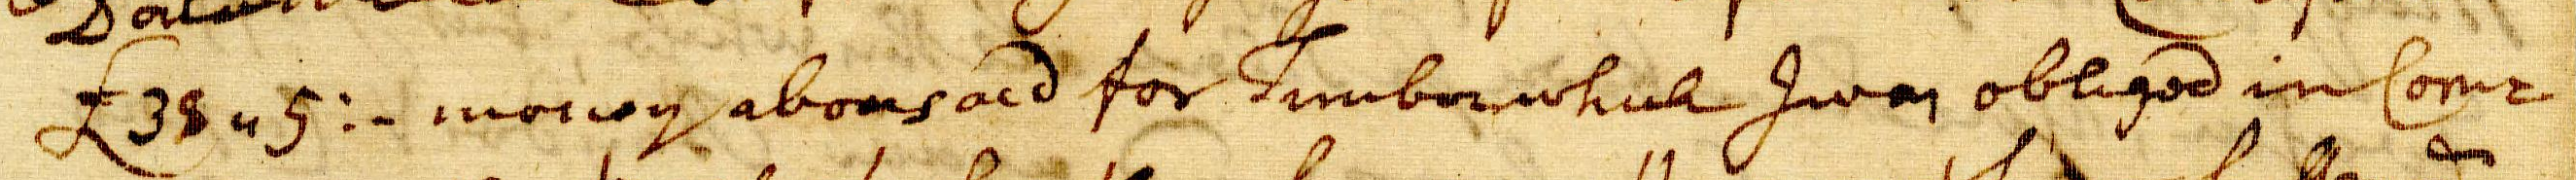₤38,,5:- money above said for Timber which I was obliged in Come
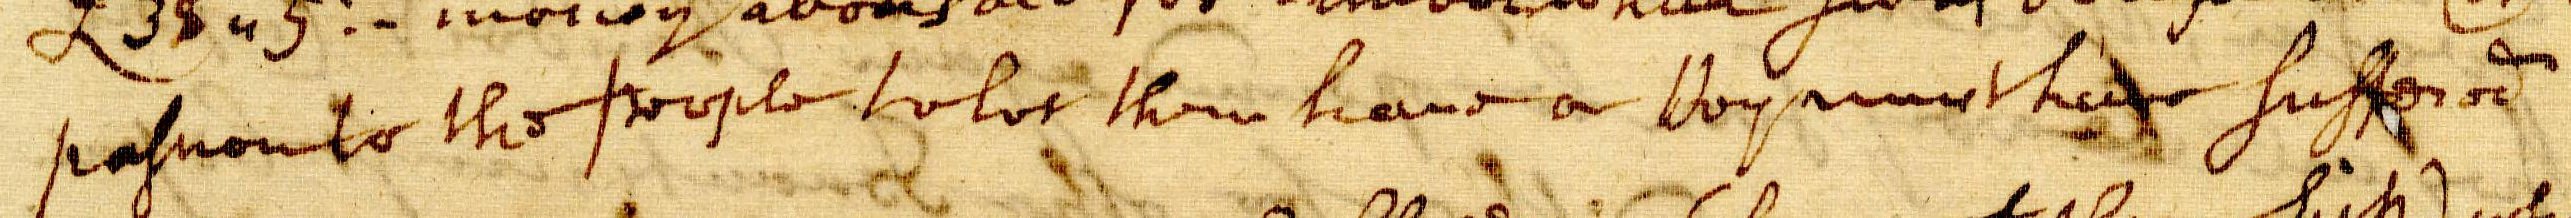pagnon to the people to let them have a Way must have suffered
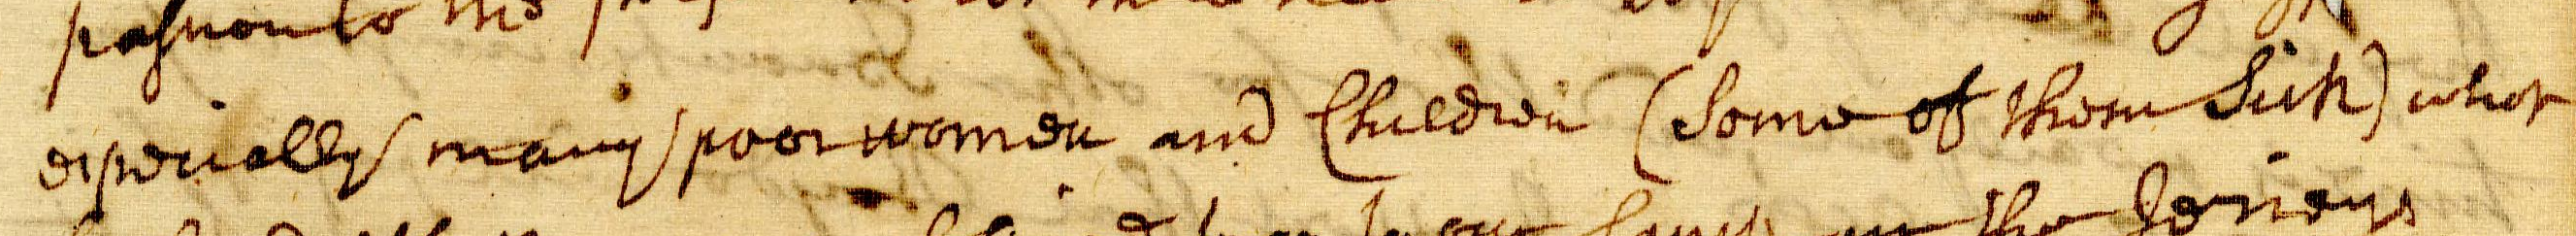especially many poor women and Children (some of them Sick) whos
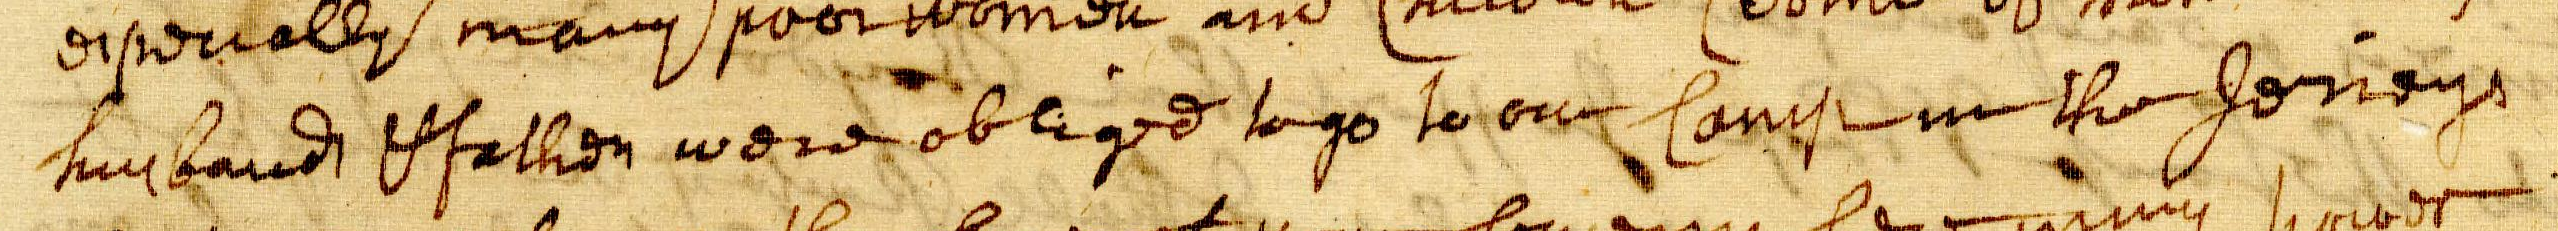husbands & fathers were obliged to go to our Camp in the Jersieys
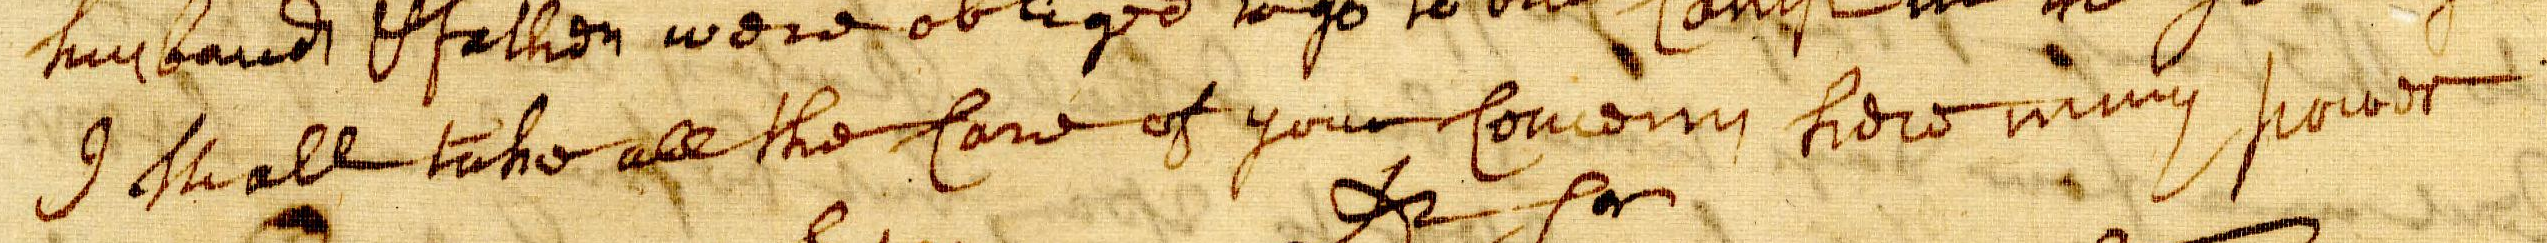I shall take all the Care of your Concerns how many power
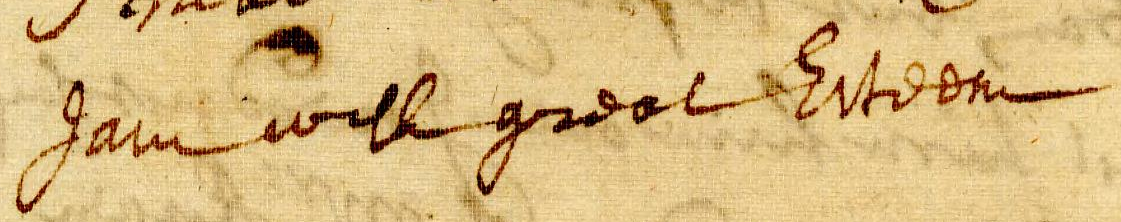I am with great Esteem
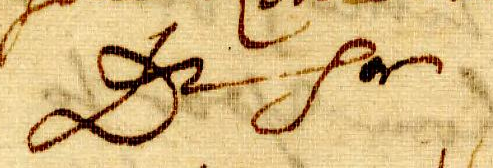D^r S^ir
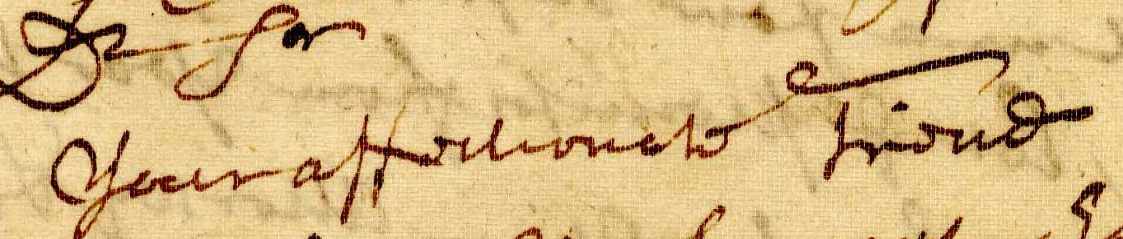Your affectionate Friend
